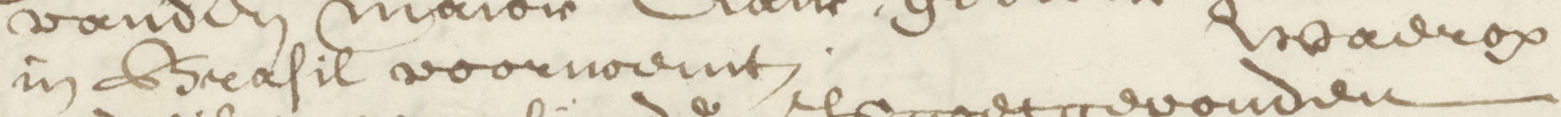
in Brasil voornoemt. Waerop
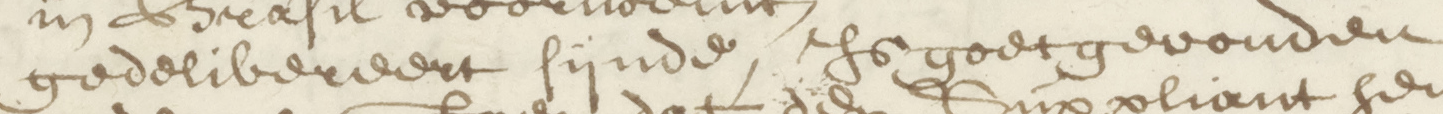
gedelibereert sijnde, Is goetgevonden
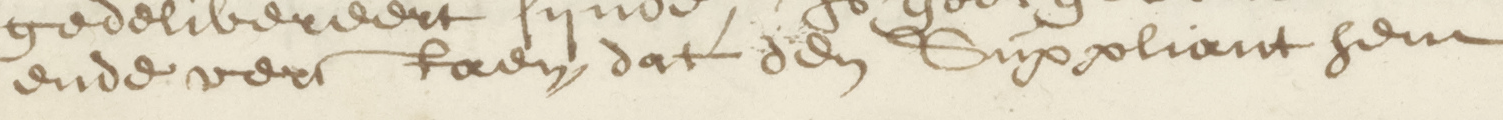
ende verstaen dat den Suppliant hem
